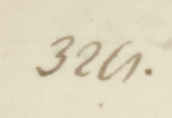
328
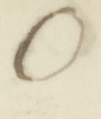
O
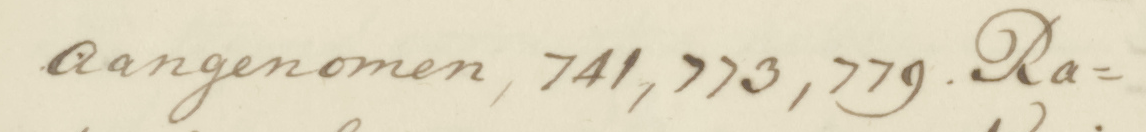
aangenomen 741, 770, 779 Ra„
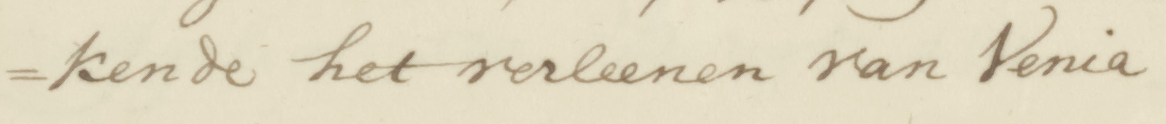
kende het verleenen van Venia
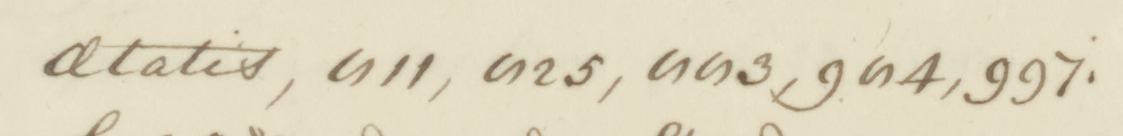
ætatis, 811, 825, 883, 984, 997.
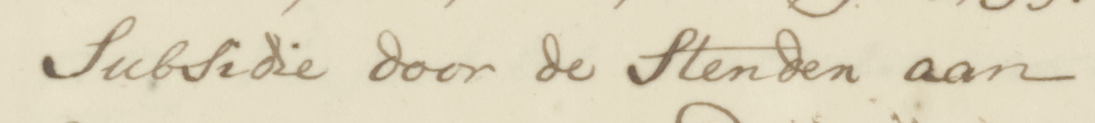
Subsidie door de Stenden aan
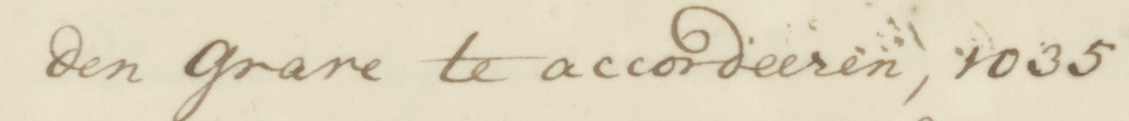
den grave te accordeeren, 1035.
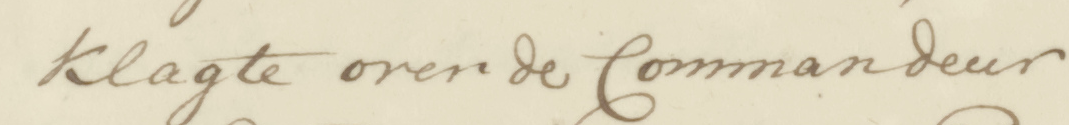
Klagte over de Commandeur
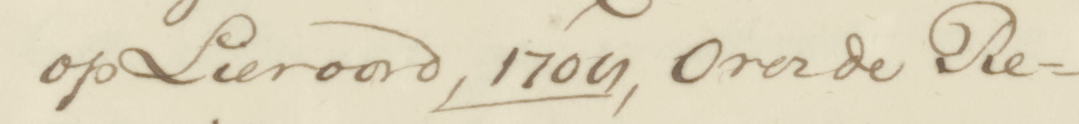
op Lieroord, 1708 Over de Re„
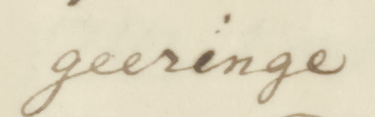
geeringe.
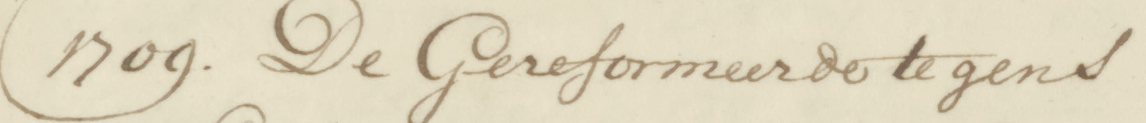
1709. De Gereformeerde tegens
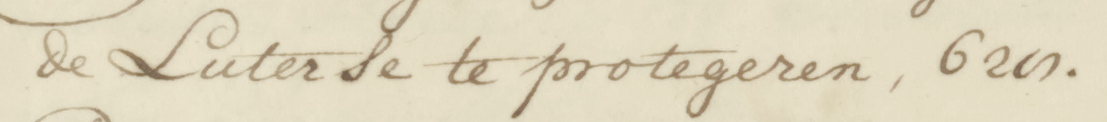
de Luterse te protegeren, 628.
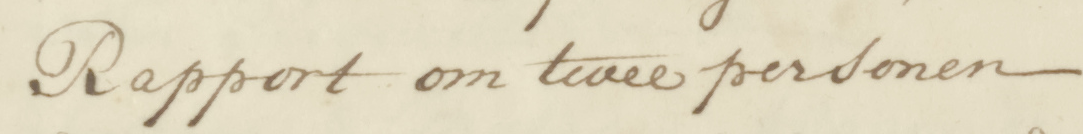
Rapport om twee personen
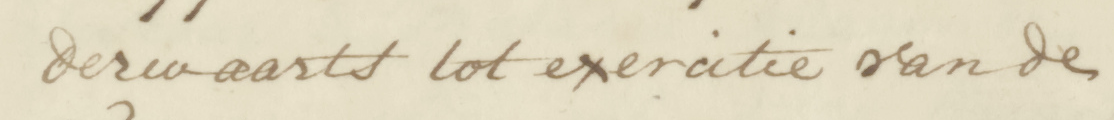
derwaarts tot exercitie van de
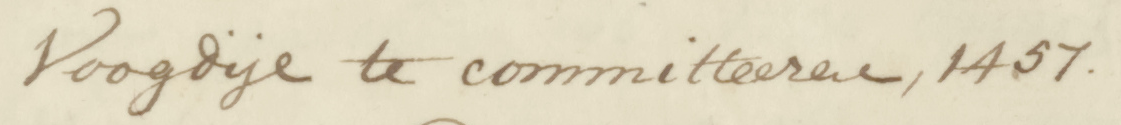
Voogdije te committeeren, 1457.
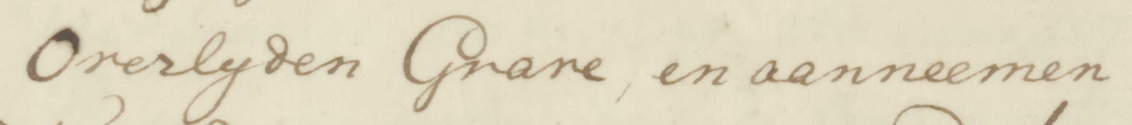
Overlijden Grave en aanneemen
